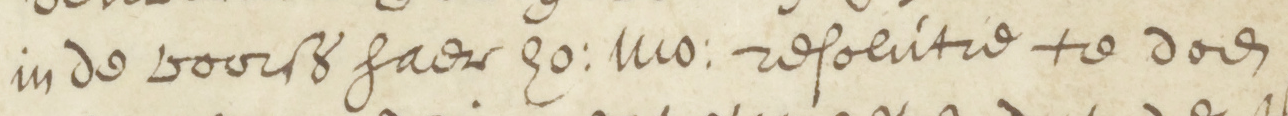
in de voors haer ho:mo: resolutie te doen
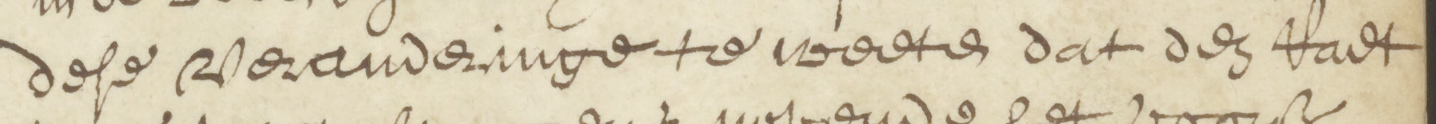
dese Veranderinge te weeten dat den Raet
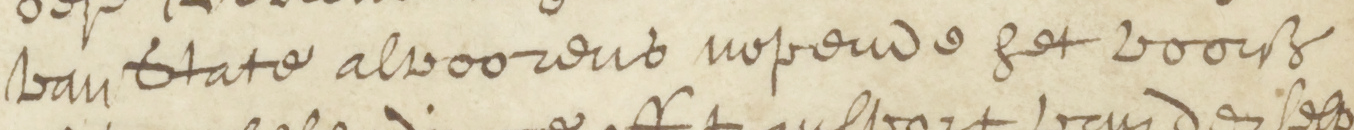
van State alvoorens nopende het voors
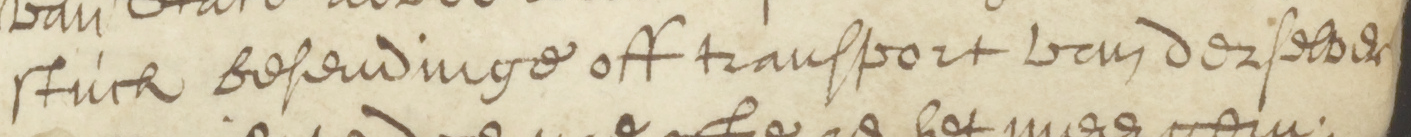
stuck besendinge off transport van derselver
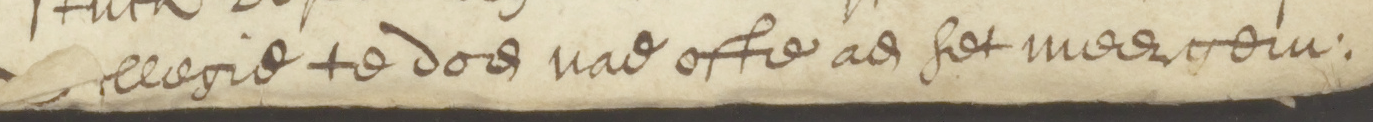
Collegie te doen nae ofte aen het meergem:
